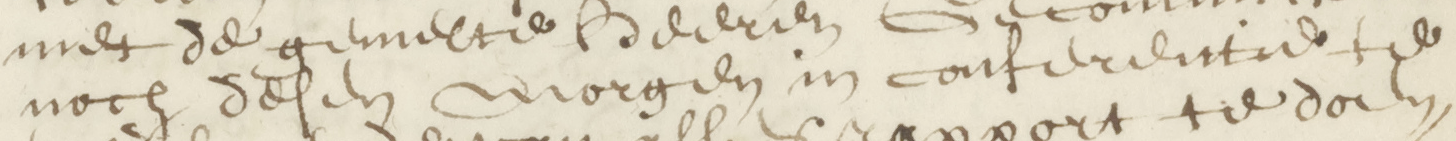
noch desen morgen in conferentie te
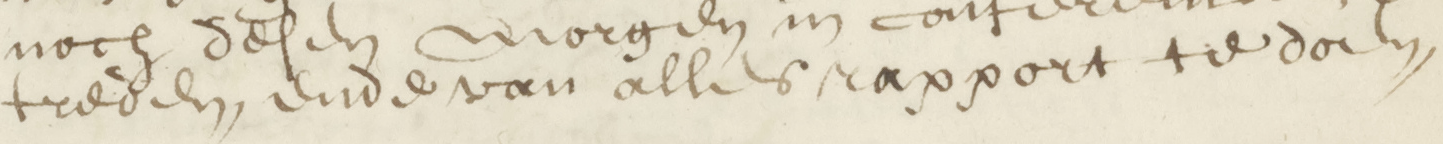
treden, ende van alles rapport te doen.
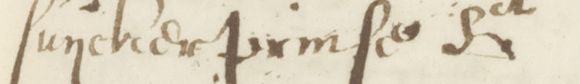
suijcker prinse St.
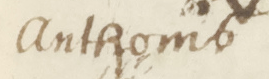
anthonis
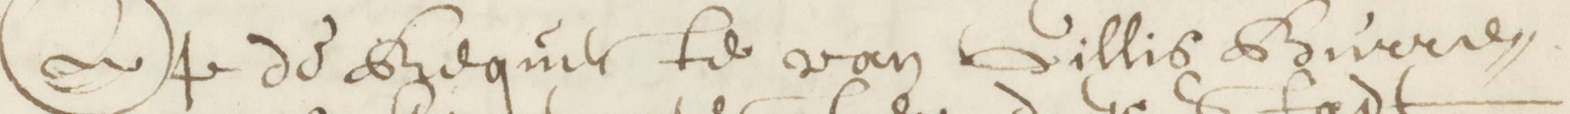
Op de requeste van Gillis Burre,,
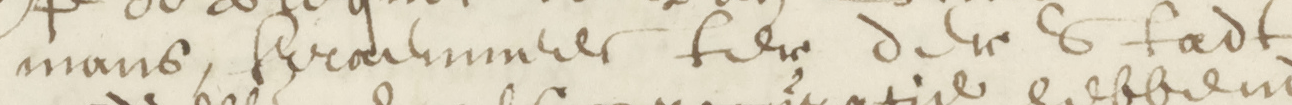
mans, kraenmeester der Stadt
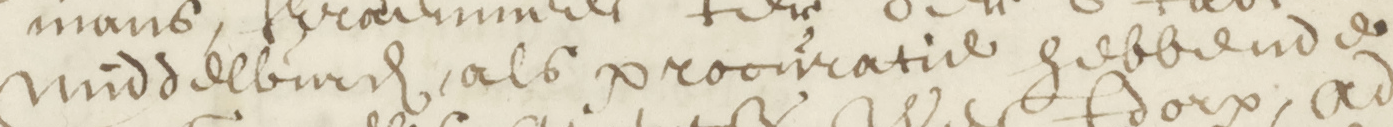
Middelburch als procuratie hebbende
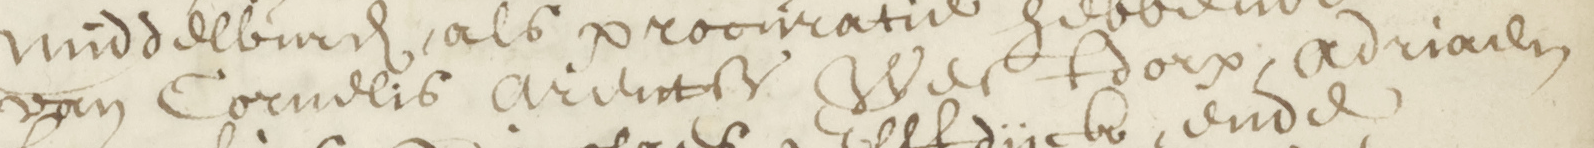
van Cornelis Arentsz Westdorp, Adriaen
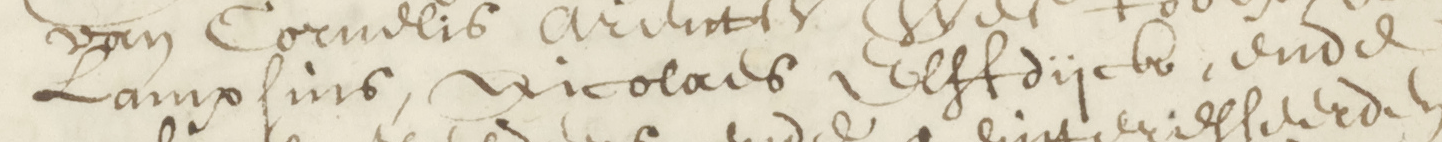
Lampsins, Nicolaes Elffdijck, ende
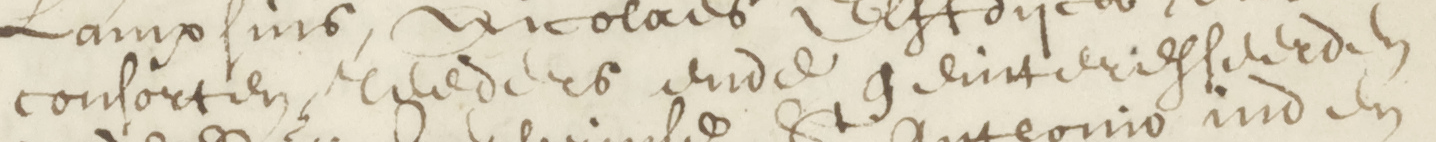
consorten, reeders ende geinteresseerden
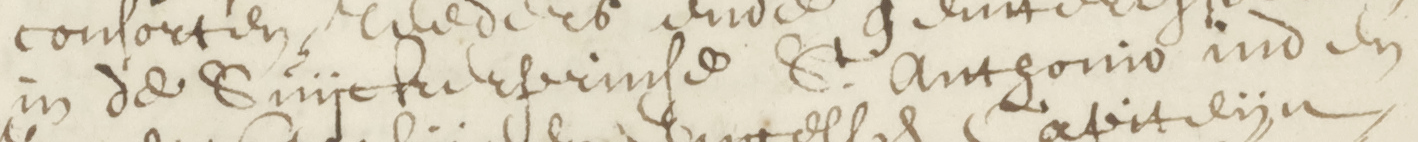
in de Suijckerprinse St. Anthonio inden
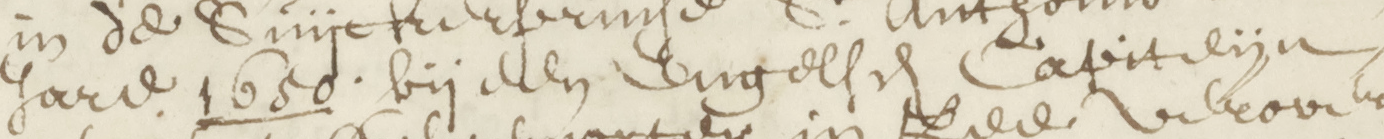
jare 1650 bij een Engelsch Capiteijn
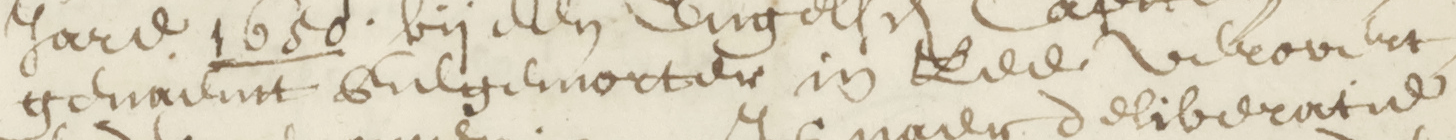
genaemt Regemorter in zee verovert
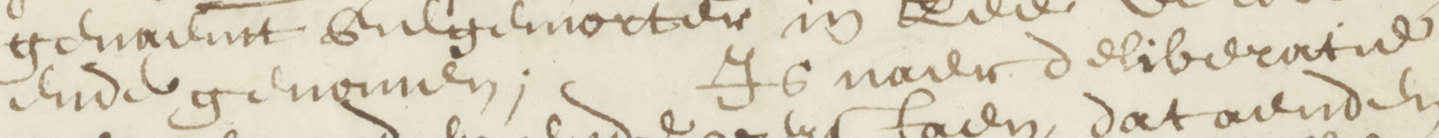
ende genomen; is naer deliberatie
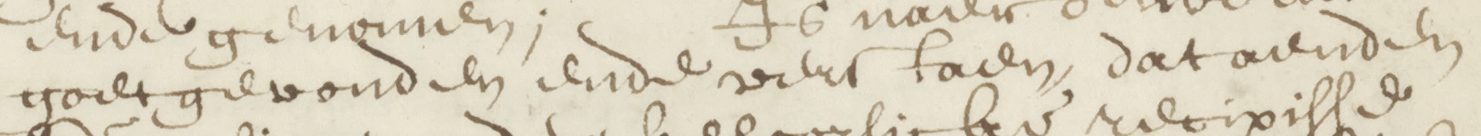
goetgevonden ende verstaen, dat aenden
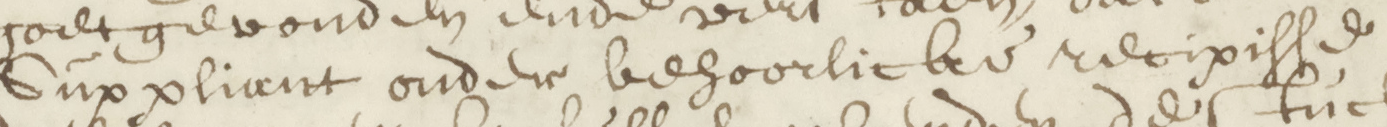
Suppliant onder behoorlicke recipisse
